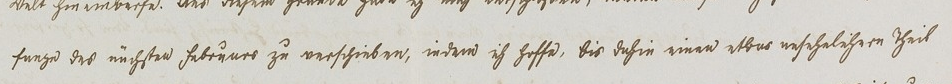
fange des nächsten Februars zu verschieben, indem ich hoffe, bis dahin einen etwas ansehnlichern Theil
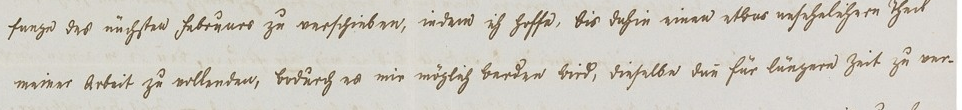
meiner Arbeit zu vollenden, wodurch es mir möglich werden wird, dieselbe dann für längere Zeit zu ver-
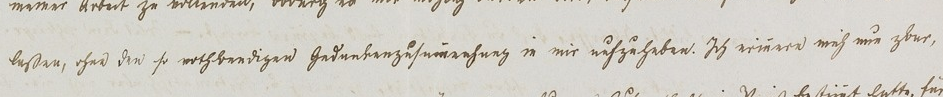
laßen, ohne den so nothwendigen Gedankenzusammenhang in mir aufzuheben. Ich erinnere mich nun zwar,
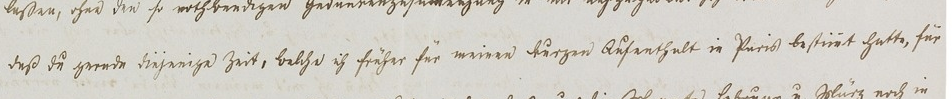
daß du gerade diejenige Zeit, welche ich früher für meinen kurzen Aufenthalt in Paris bestimmt hatte, für
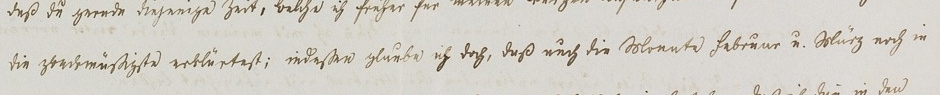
die zweckmäßigste erklärtest; indeßen glaube ich doch, daß auch die Monate Februar u. März noch in
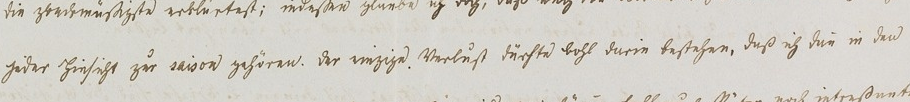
jeder Hinsicht zur saison gehören. Der einzige Verlust dürfte wohl darin bestehen, daß ich dann in den
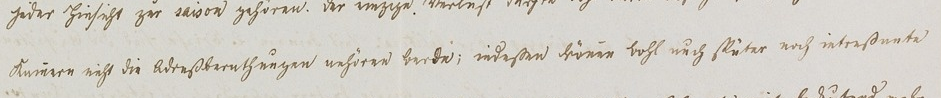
Kammern nicht die Adreßberathungen anhören werde; indeßen können wohl auch später noch intreßante
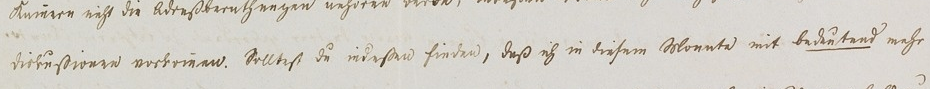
Diskußionen vorkommen. Solltest du indeßen finden, daß ich in diesem Monate mit bedeutend mehr
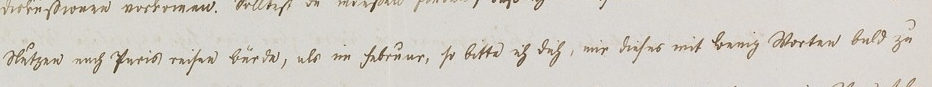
Nutzen nach Paris reisen würde, als im Februar, so bitte ich dich, mir dieses mit wenig Worten bald zu
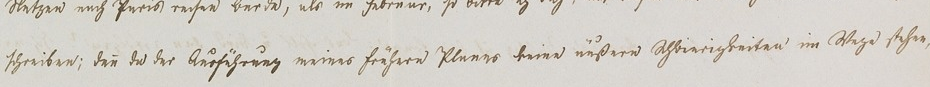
schreiben; denn da der Ausführung meines frühern Planes keine äußern Schwierigkeiten im Wege stehen,
